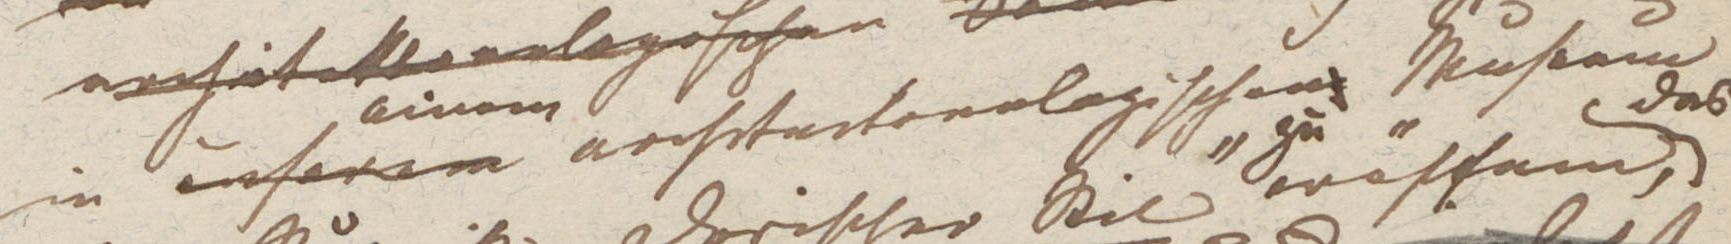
in unserem einem architectonologischemn Museum
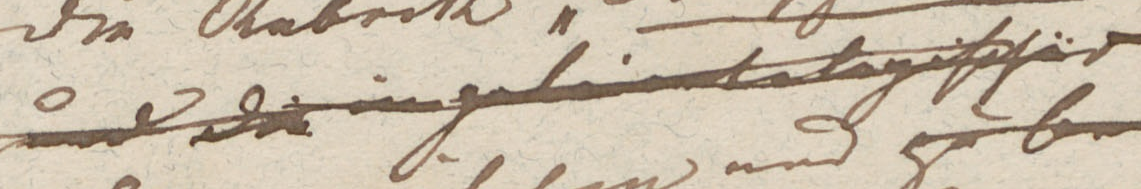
und die in paläontologischer
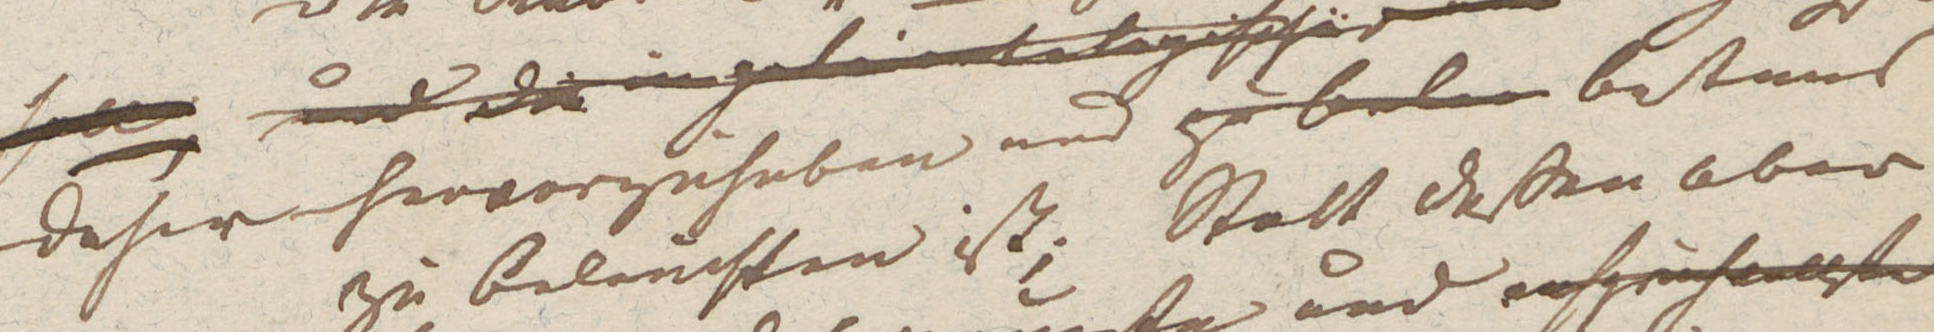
daher hervorzuheben und zu beleu bestens
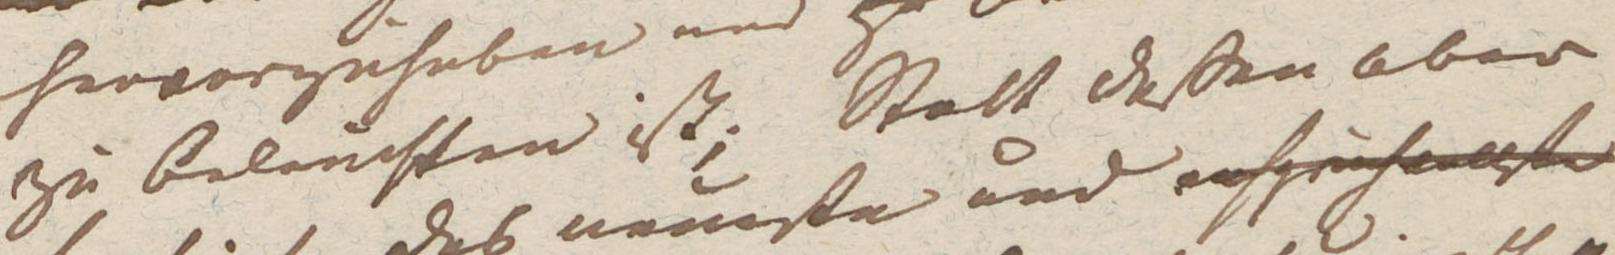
zu beleuchten ist; Statt dessen aber
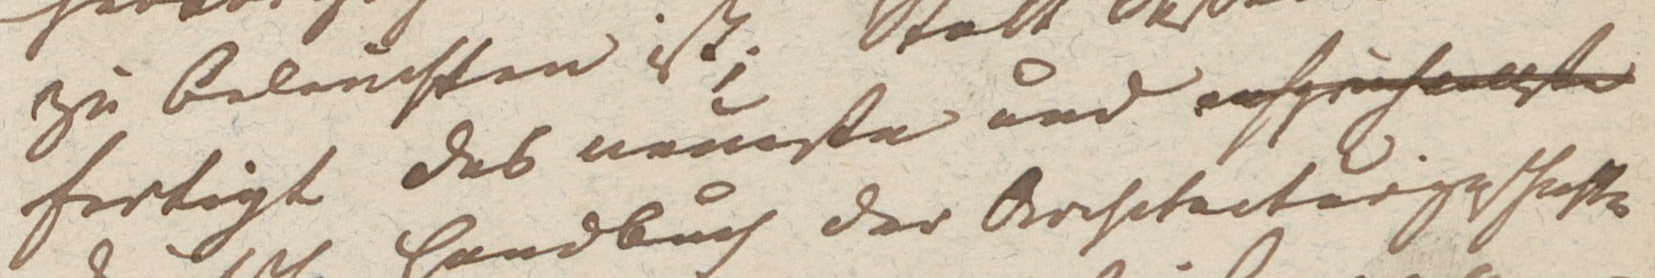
fertigt das neueste und anspruchvollste
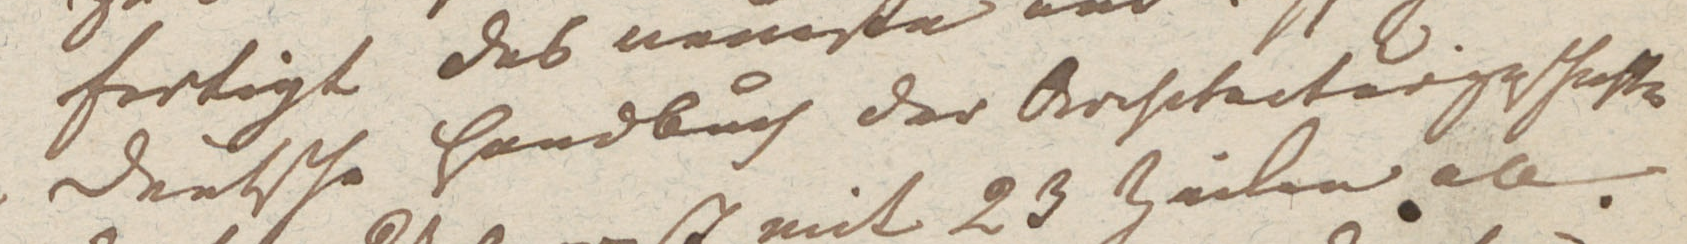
Deutsche Handbuch der Architecturgeschichte
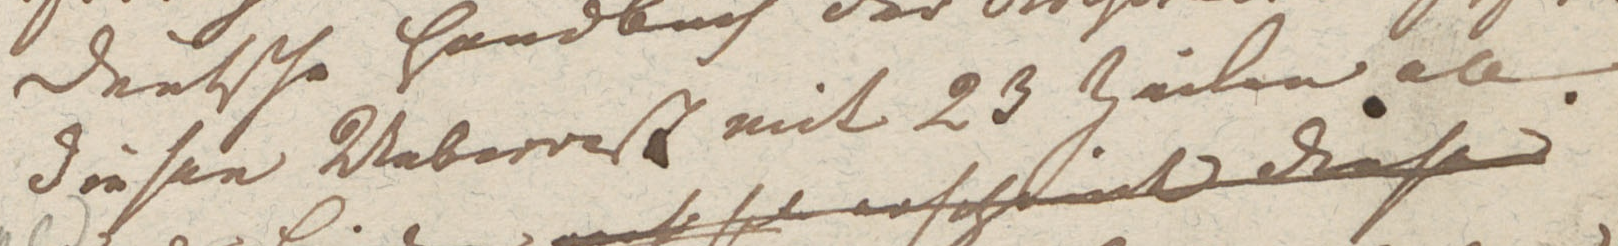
diesen Ueberrest mit 23 Zeilen ab.
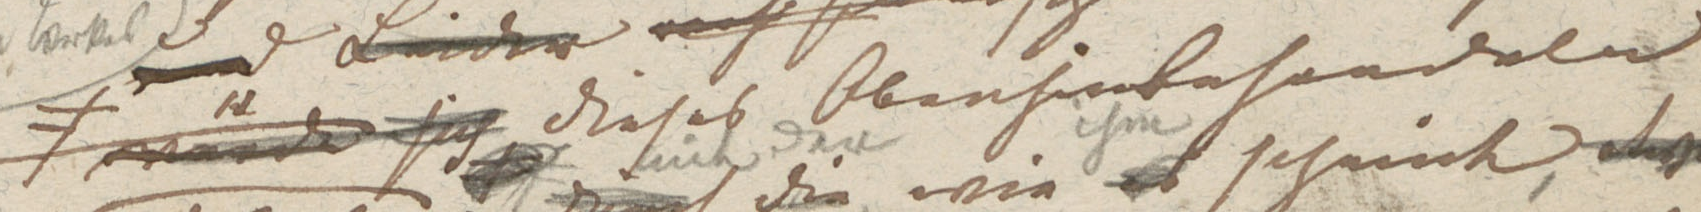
% würde sich dieses Oberhinbehandeln
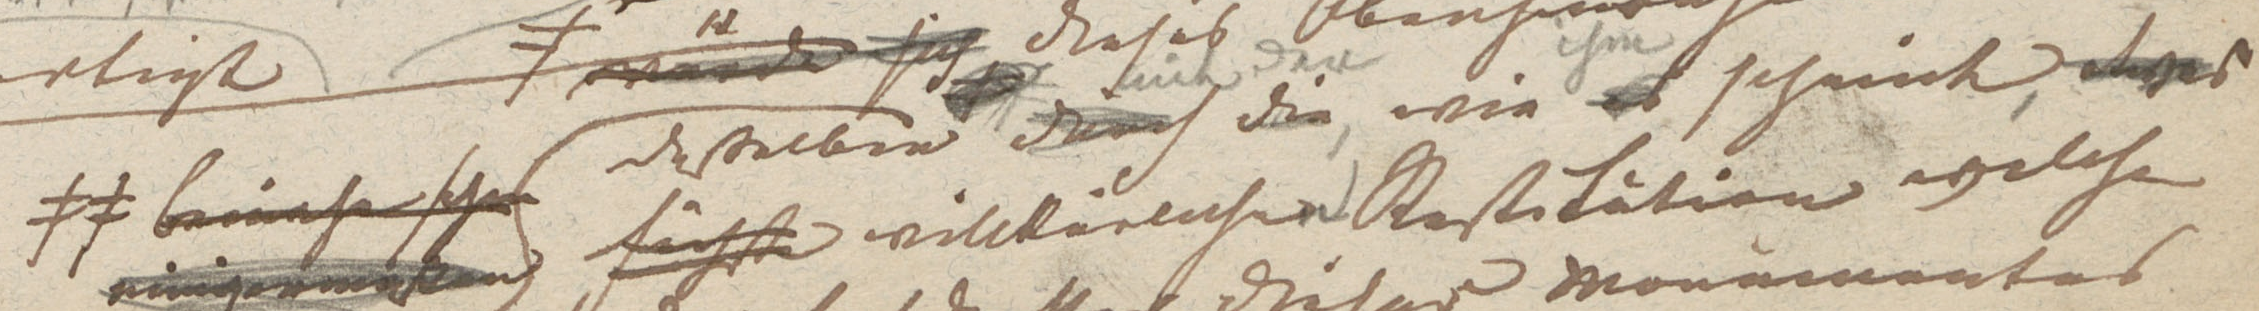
desselben % durch die mit der, wie es ihm scheint, etwas
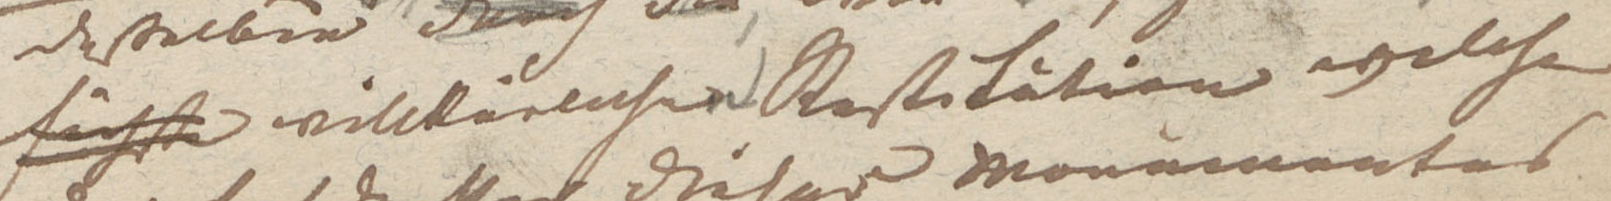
höchst willkürlichen Restitution welche
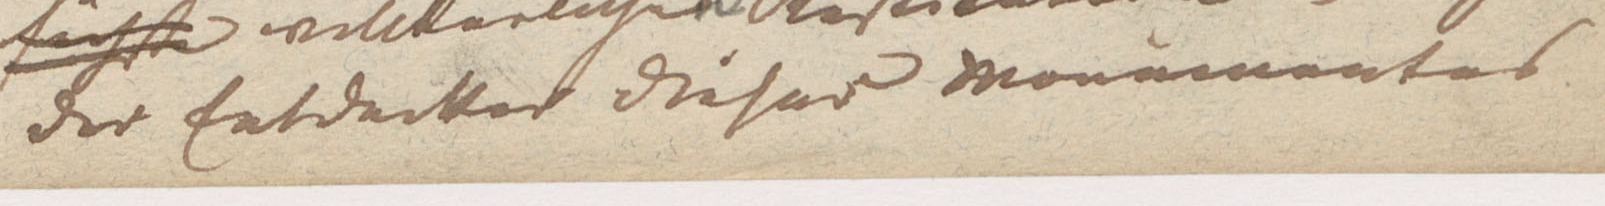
der Entdecker dieses Monumentes
